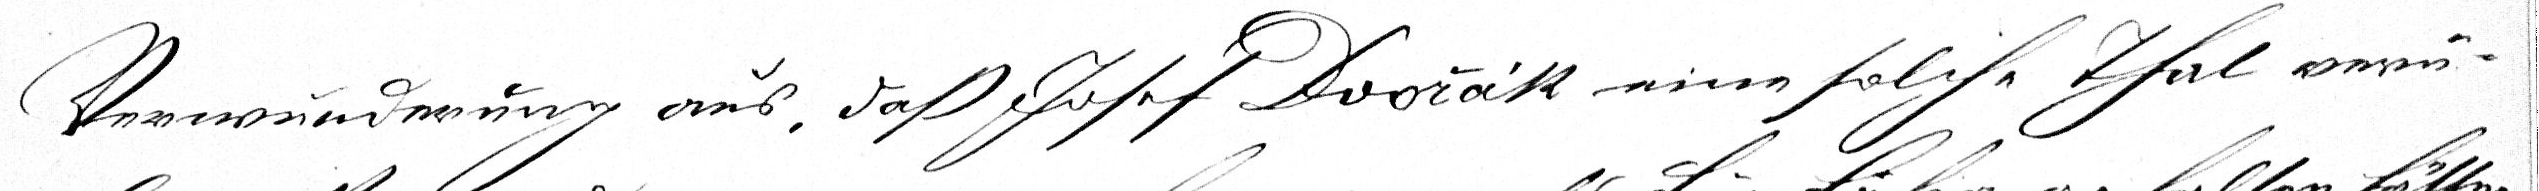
Verwunderung aus, daß Josef Dvořák eine solche That verü¬
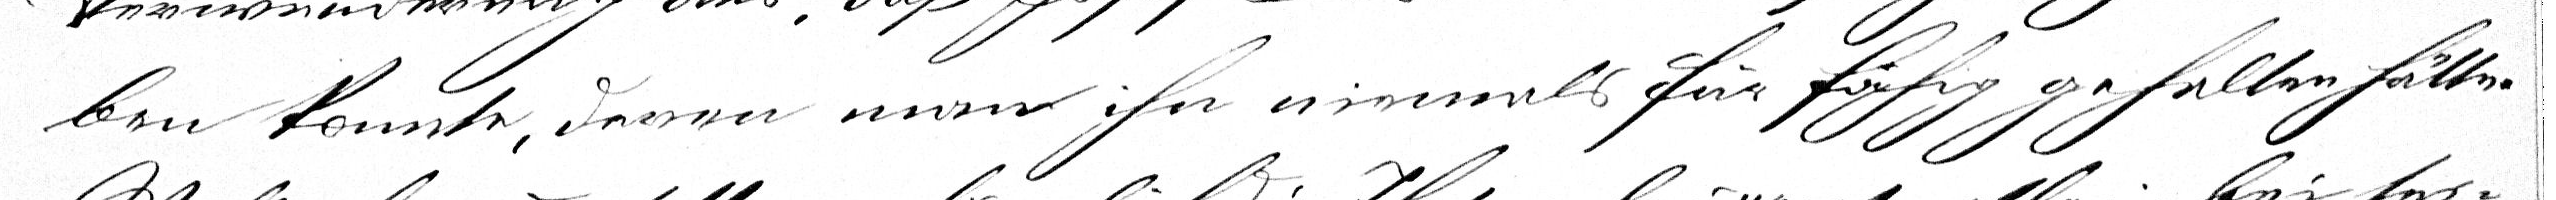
ben konnte, deren man ihn niemals für fähig gehalten hätte.
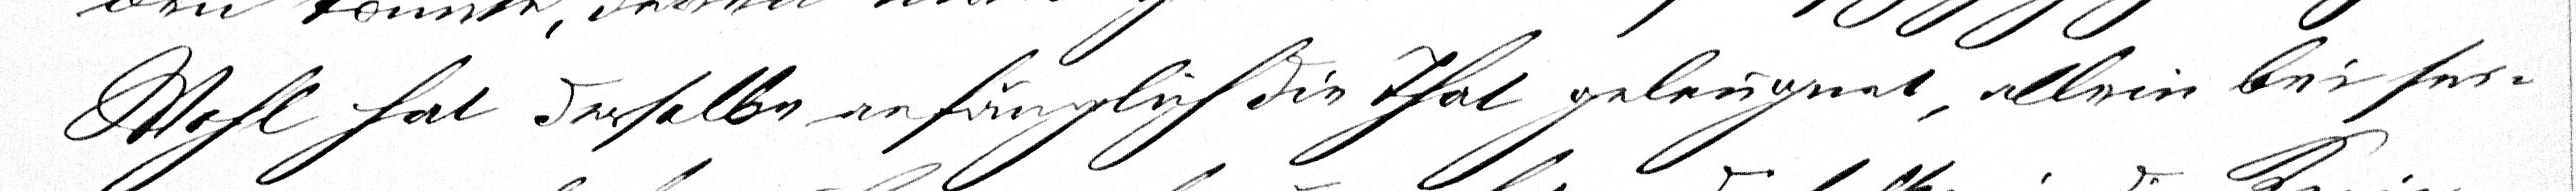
Wohl hat derselbe anfänglich die That geleugnet, allein bei sei¬
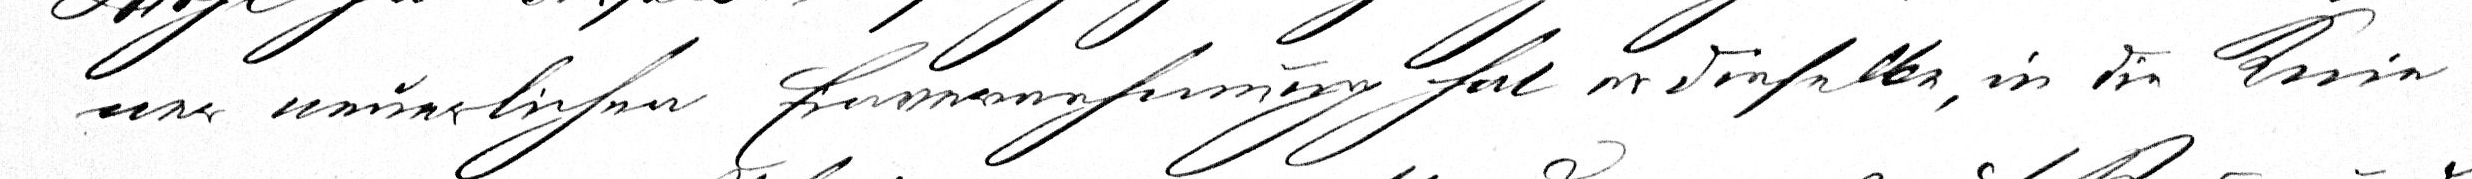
ner neuerlichen Einvernehmung hat er dieselbe, in die Knie
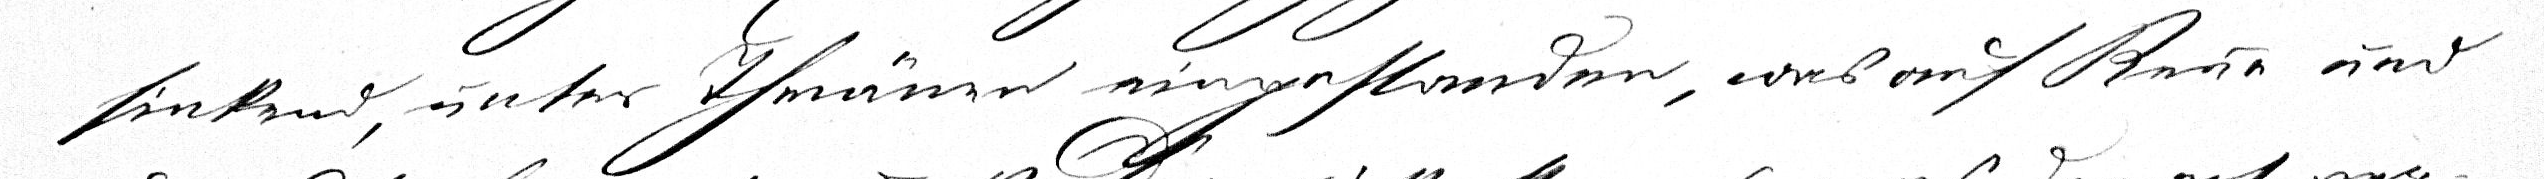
sinkend, unter Thränen eingestanden, was auf Reue und
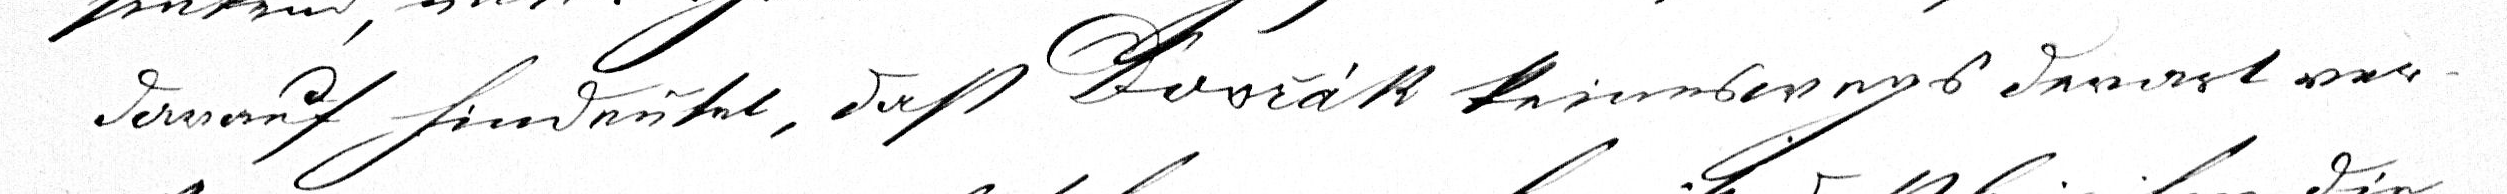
darauf hindeutet, daß Dvořák keineswegs derart ver¬
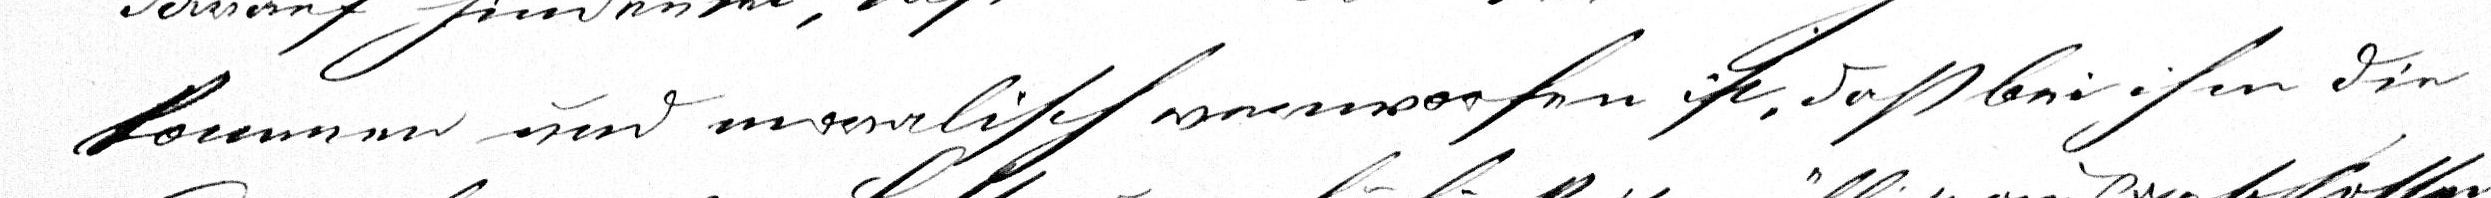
kommen und moralisch verworfen ist, daß bei ihm die
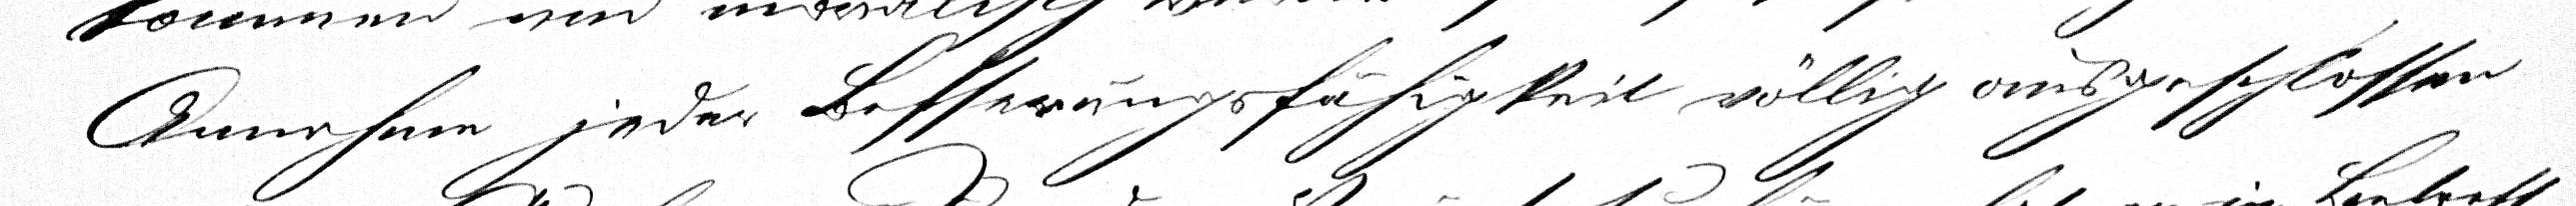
Annehme jeder Bessesungsfähigkeit völlig ausgeschlossen
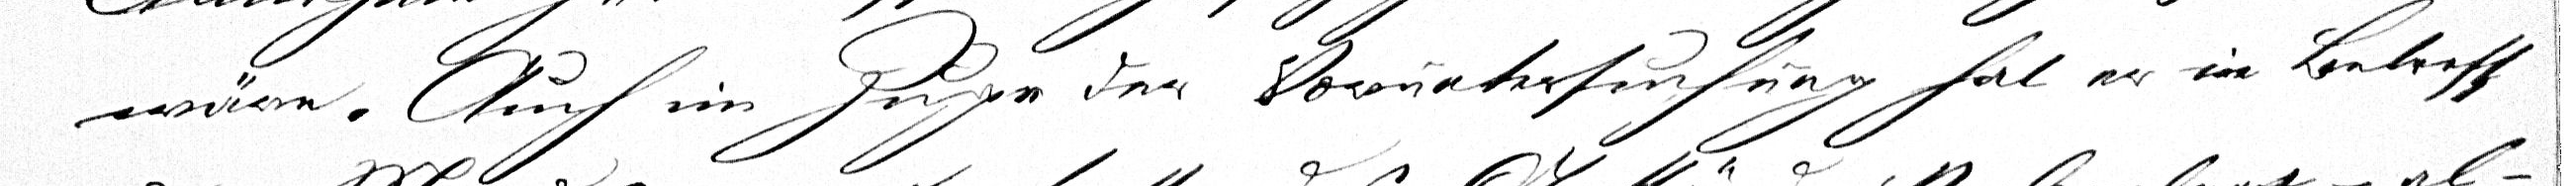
wäre. Auf im Zuge der Voruntersuchung hat er in Betreff
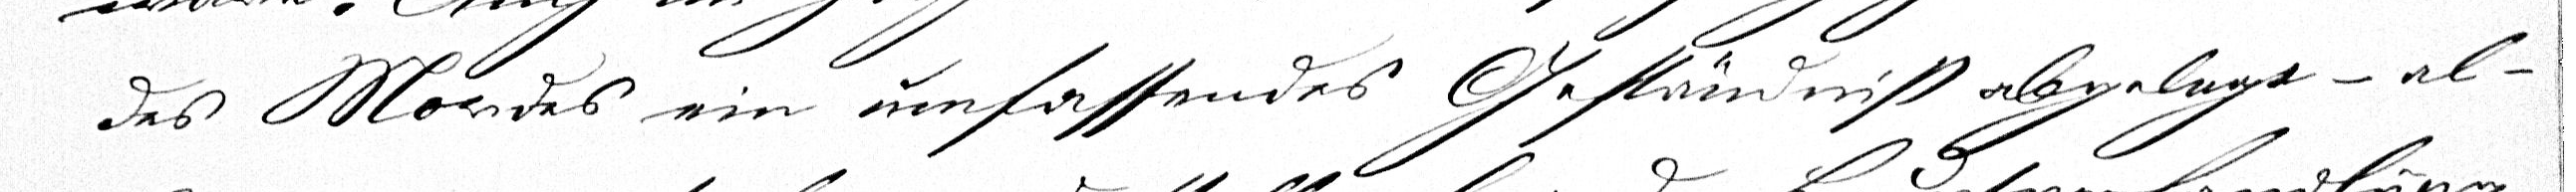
des Mordes ein umfassendes Geständniß abgelegt - al¬
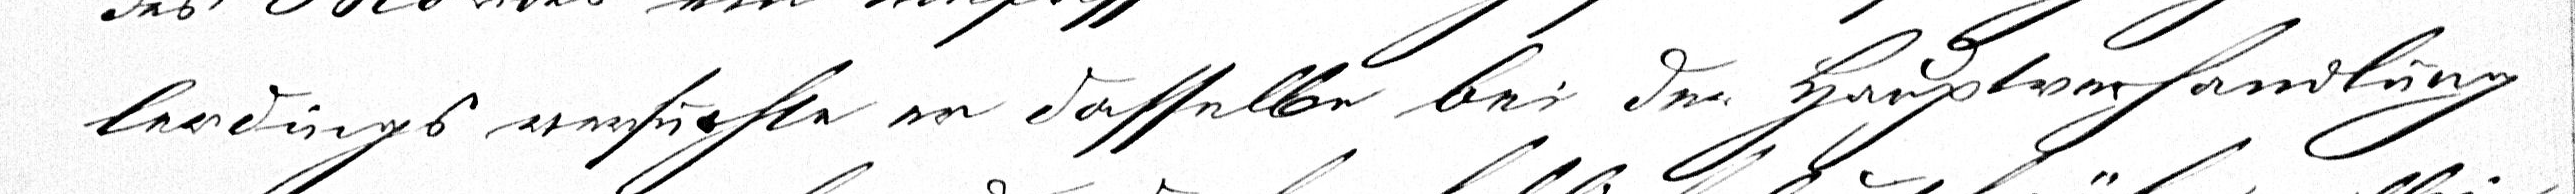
lerdings versuchte er dasselbe bei der Hauptverhandlung
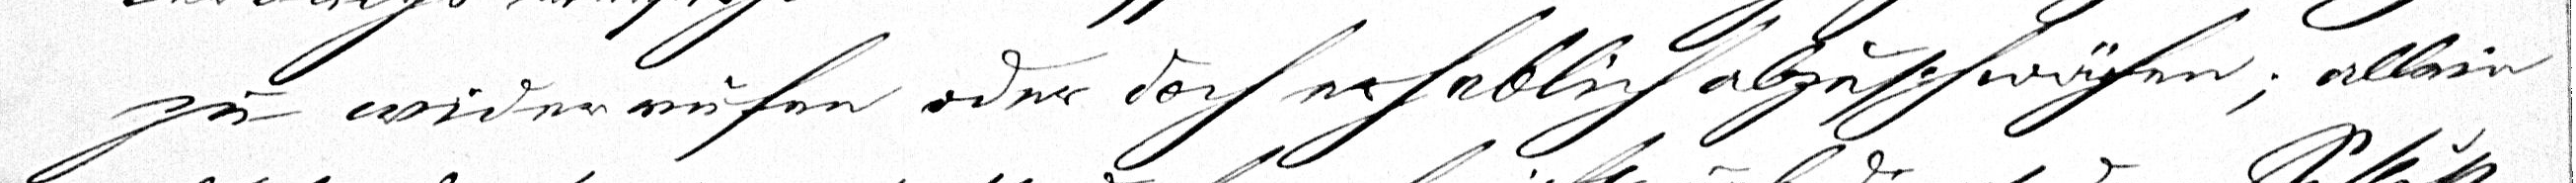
zu wider rufen der doch erheblich abzuschwächen; allein
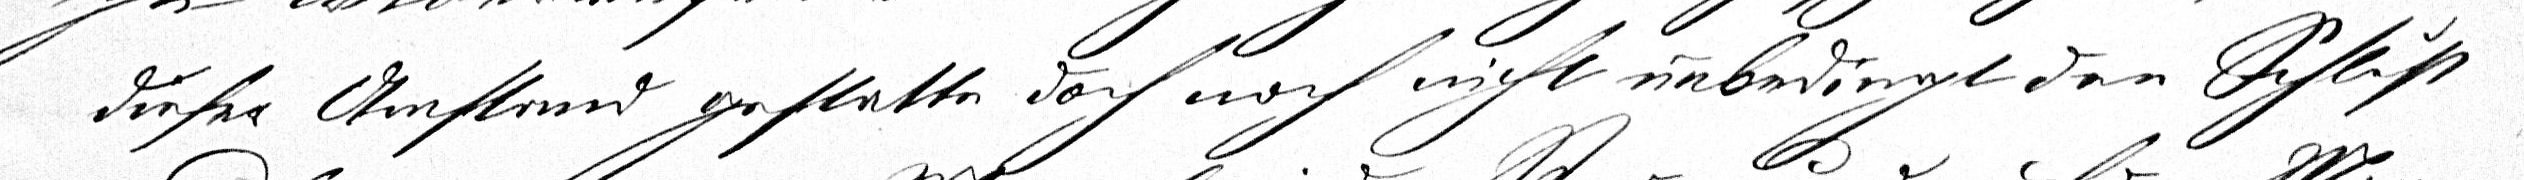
dieses Umstand gestatte doch noch nicht unbedingt den Schluß
